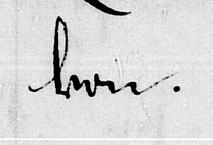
kon.
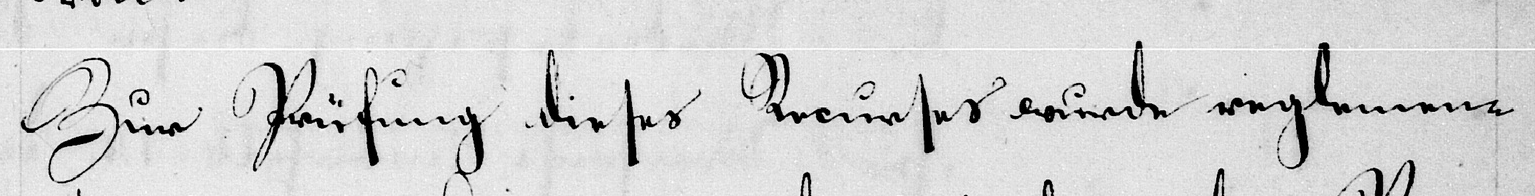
Zur Prüfung dieses Recurses wurde reglemen¬
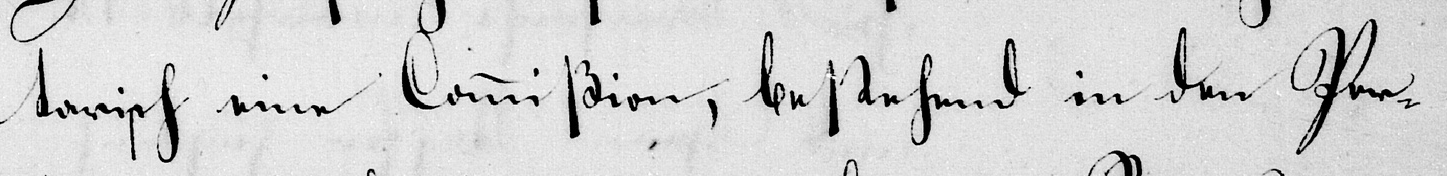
tarisch eine Commißion, bestehend in den Per¬
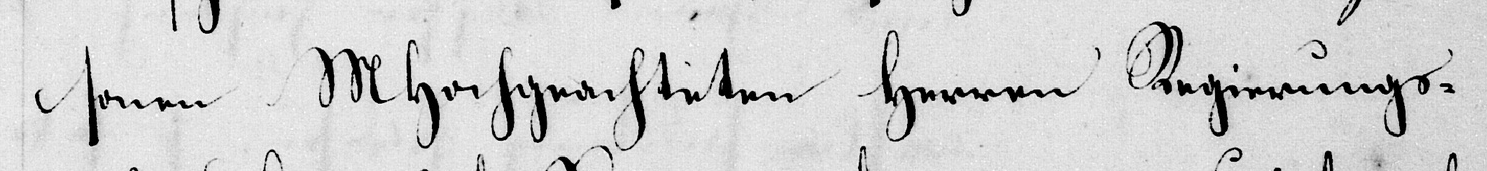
sonen MHochgeachteten Herren Regierungs¬
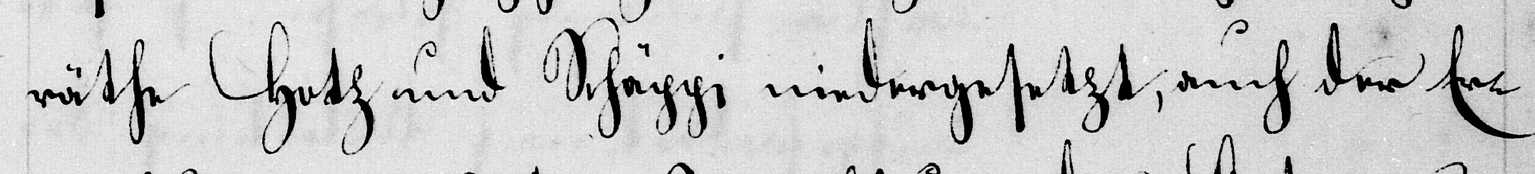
räthe Hotz und Schäppi niedergesetzt, auch der Er¬
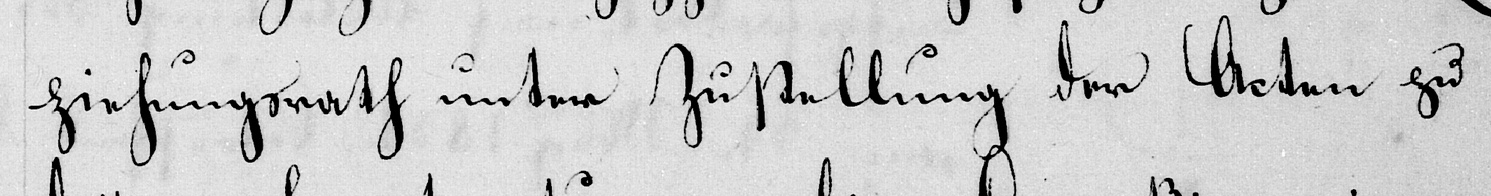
ziehungsrath unter Zustellung der Acten zu
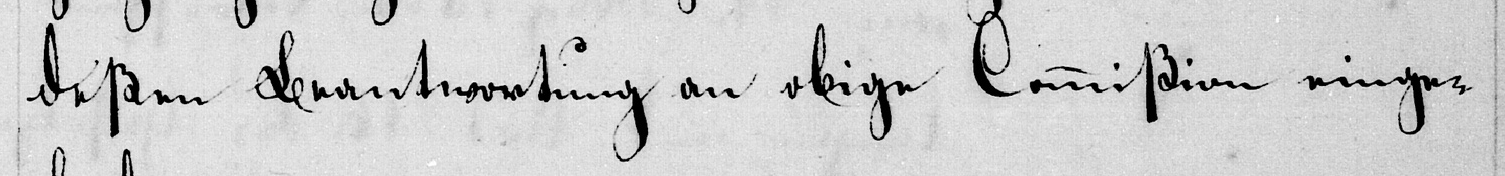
deßen Beantwortung an obige Commißion einge¬
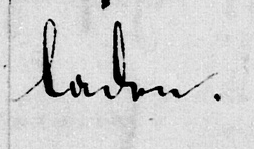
laden.
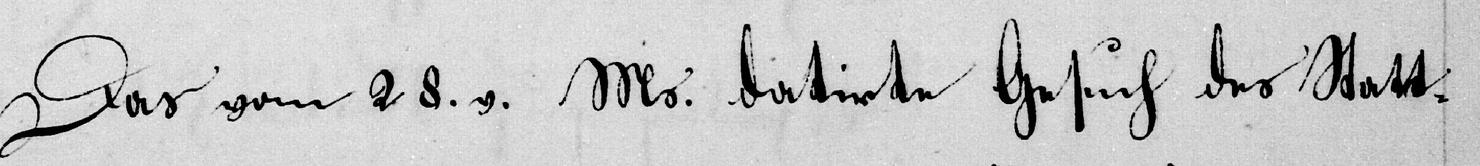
Das vom 28. v. Ms. datirte Gesuch des Statt¬
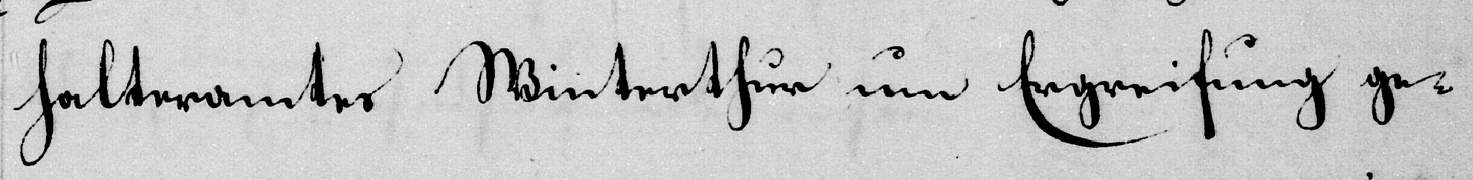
halteramtes Winterthur um Ergreifung ge-
